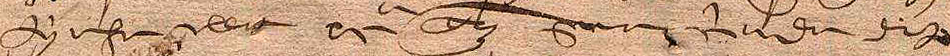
tynha ella e ca ḡlz sua ciada dito
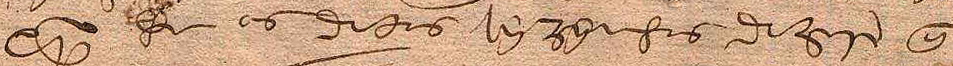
e p̄o lhe as ditas vyzynhas dizerē q̄
